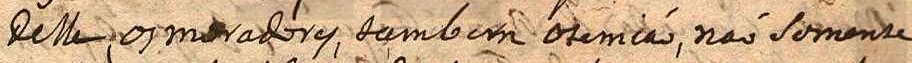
delle, os moradores, tambem o temiaõ, naõ somente
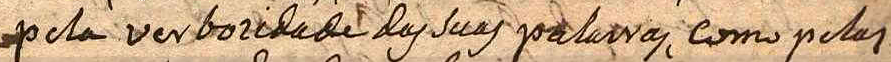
pela verbozidade das suas palavras, como pelas
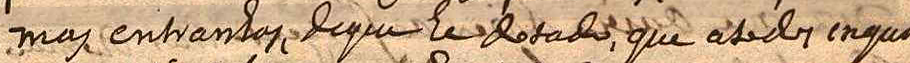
mas entranhas, de que he dotado, que a todos enqui
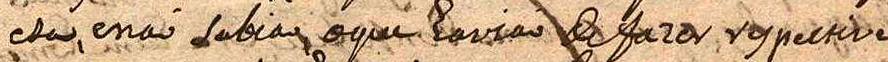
eta, e naõ sabia o que haviaõ de fazer respective
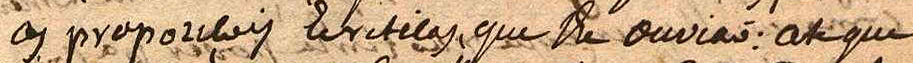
as propozeçois hereticas, que lhe ouviaõ: ate que
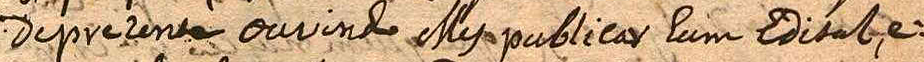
de prezente ouvindo elles publicar hum Edital, e
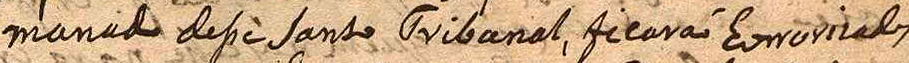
manado desse santo Tribunal, ficaraõ horrorizados
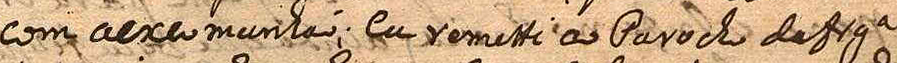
com a excomunhaõ; eu remetti ao Parocho da frga
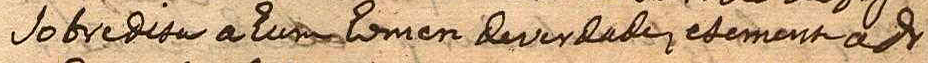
sobredita a hum homen de verdade, e temente a ds̄
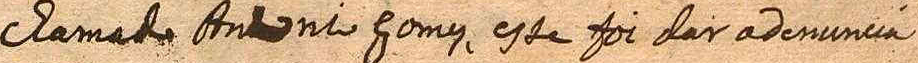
chamado Antonio Gomes, este foi dar a denuncia
